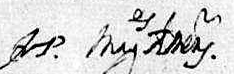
frs̄. Mages d̄ Men̄s.
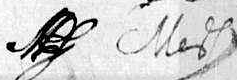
Mexa
